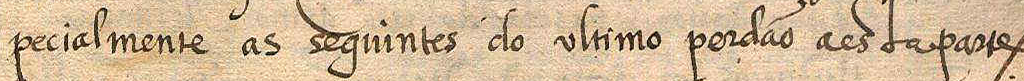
pecialmente as seguintes do vltimo perdão a esta parte /.
